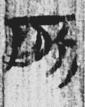所
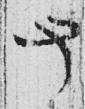又（有）
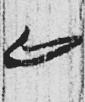㠯（以）
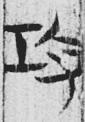攻
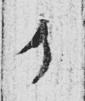人
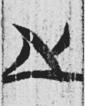之
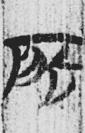所
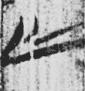亡
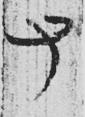又（有）
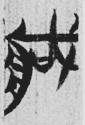戕（莊）
